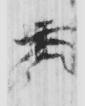而
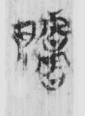{貝丙口丙口}
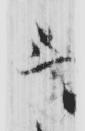之
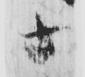古
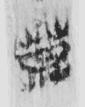莫
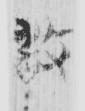敢
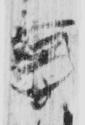怠
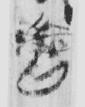㠯（以）
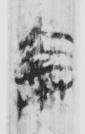{亢廾}
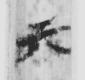亓
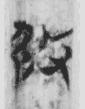攸
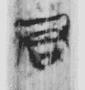君
